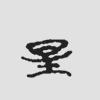星
